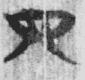四
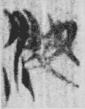○（海）
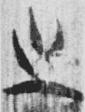之
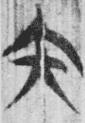內
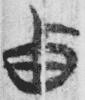貞
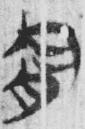○（禽）
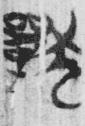獸（兽）
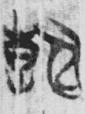朝
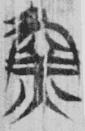魚
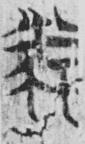○（鱉）
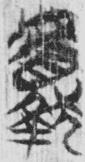○（獻）
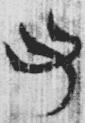又（有）
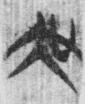吳（無）
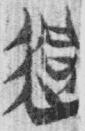迵（通）
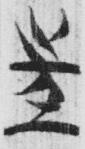○（匡）
